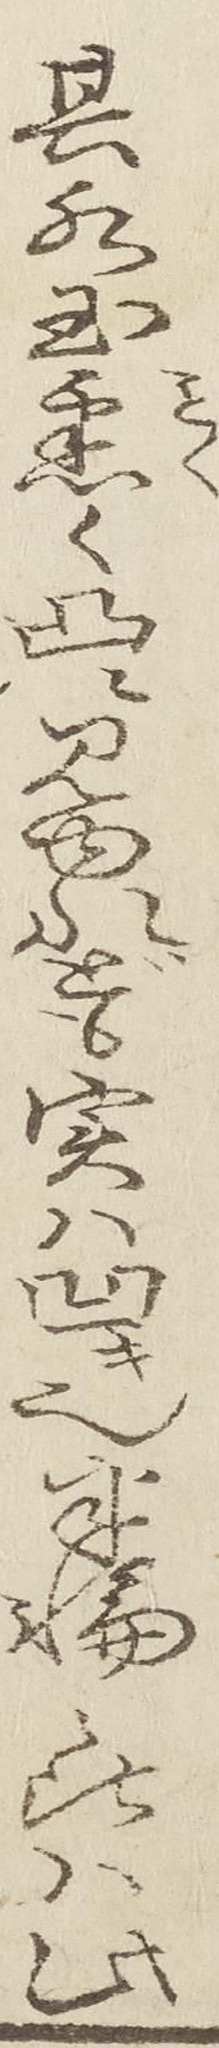其水玉悉く凸ニ見ゆれども実は凹キ也半輪之比は此
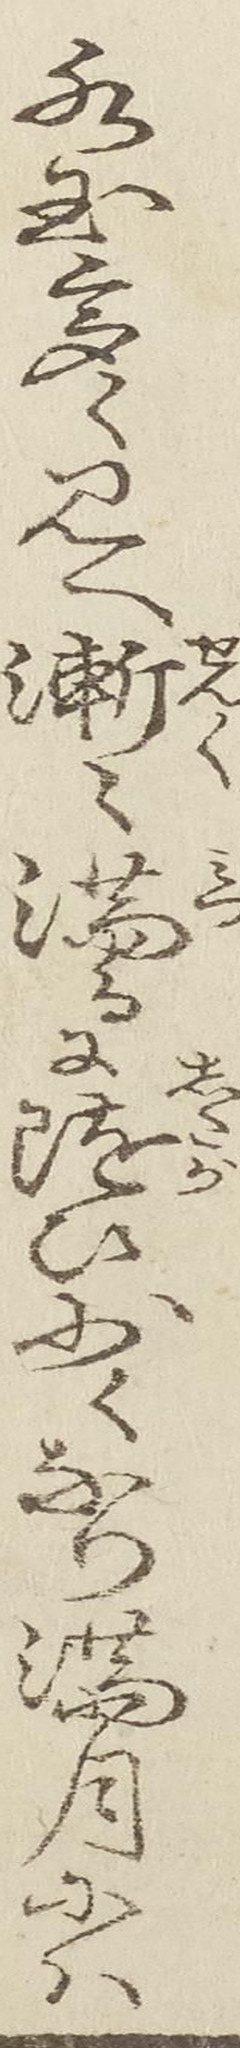水玉多く見へ漸々満るに随ひ少くなり満月には
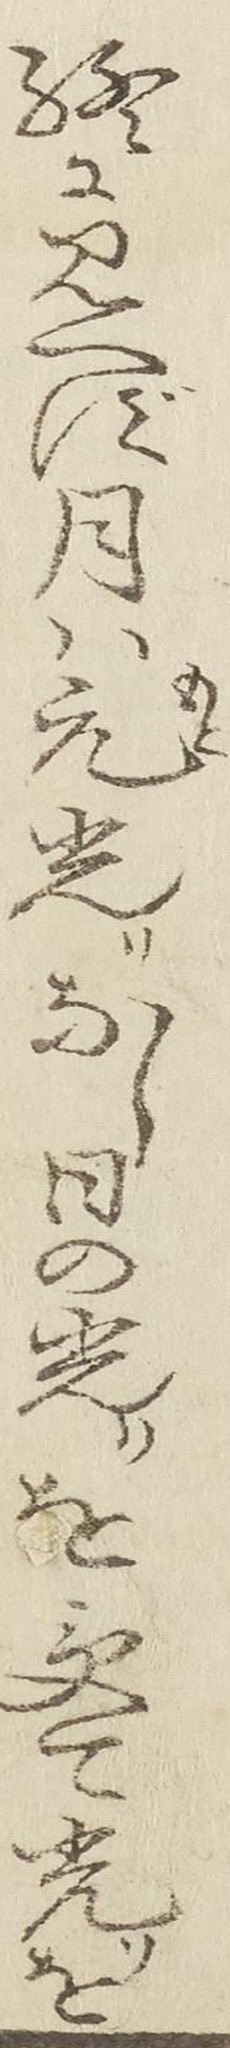終に見へず月は元光リなし日の光リを受て光リを
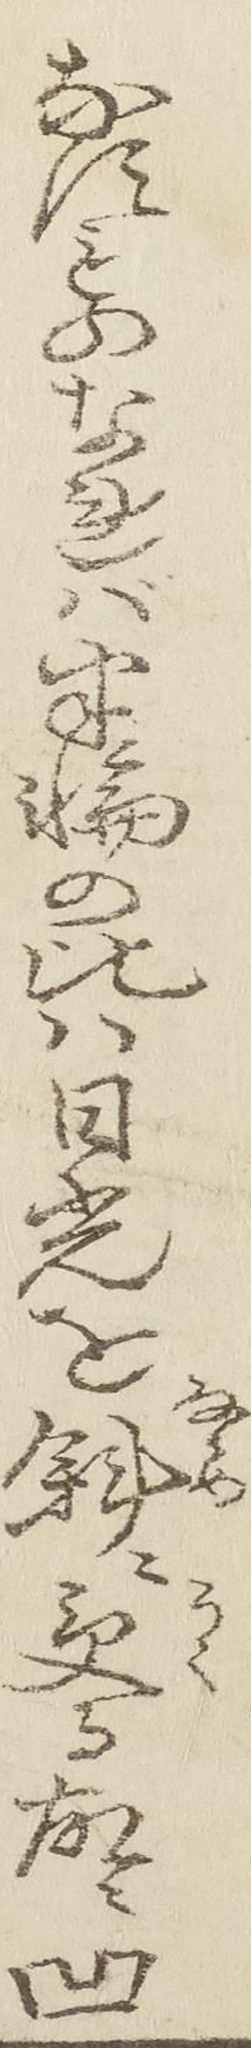なすものなれば半輪の比は日光を斜ニ受る故ニ凹
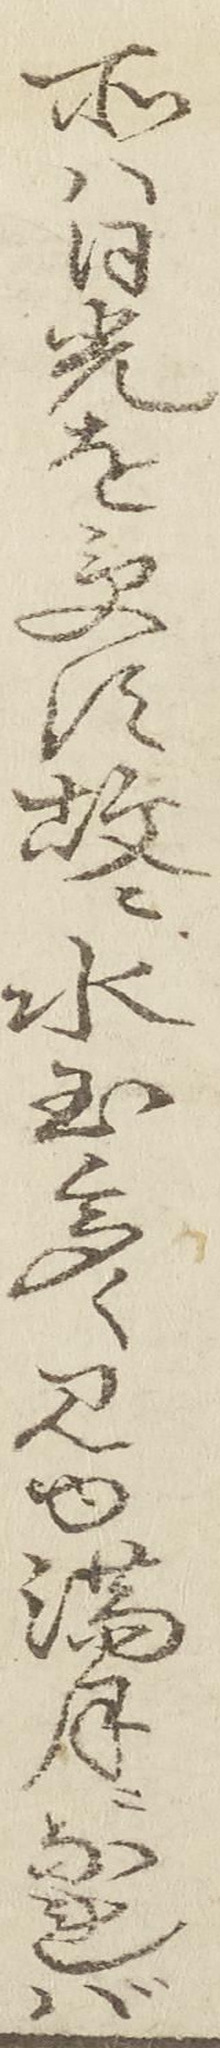所は日光を受す故ニ水玉多く見ゆ満月ニなれば
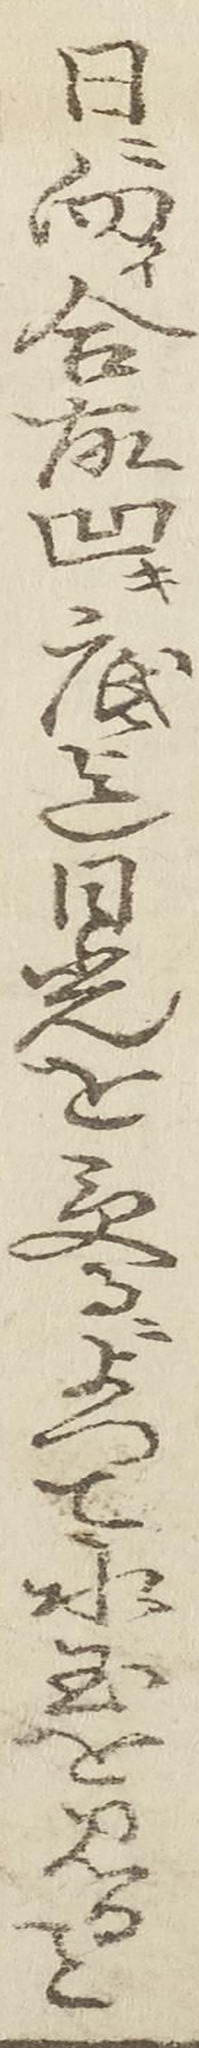日ニ向イ合故凹キ底迄日光を受るニよつて水玉を見ること
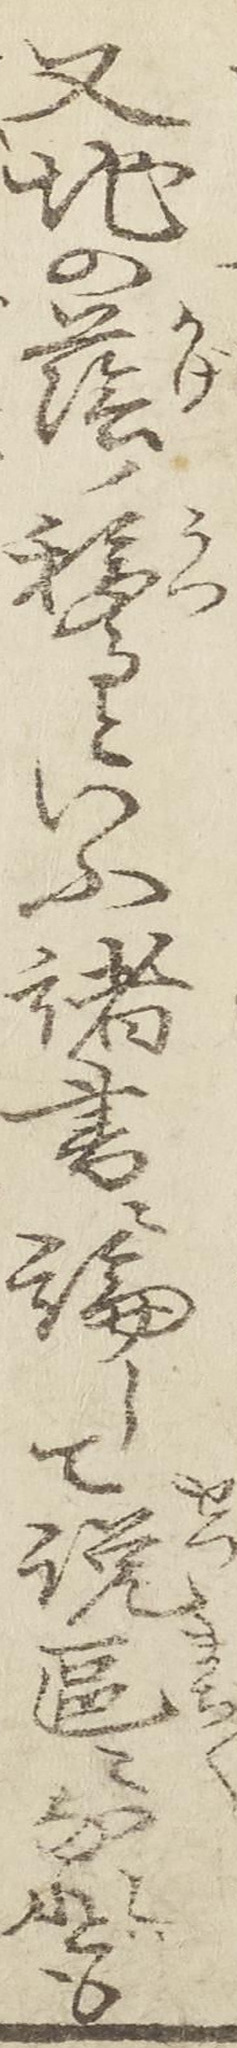又地の蔭ノ移るといふ諸書ニ論して説区々になれども
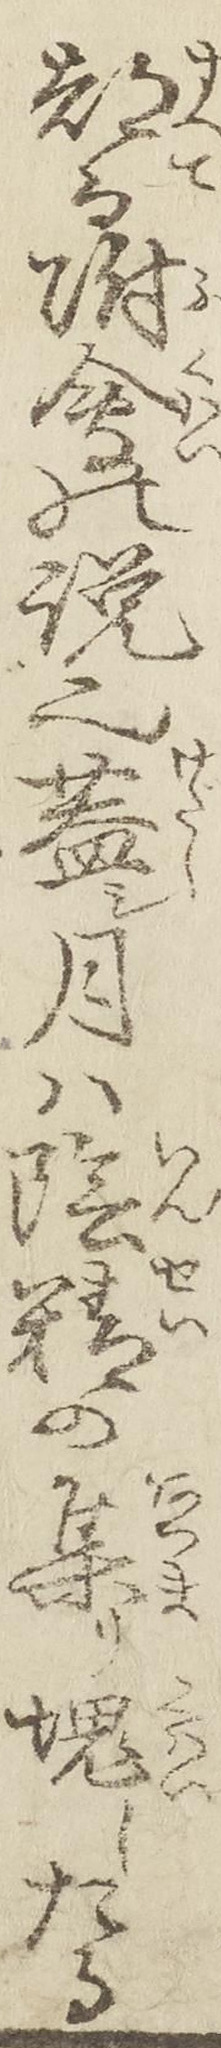都而附会の説也蓋シ月は陰精の集リ塊したる
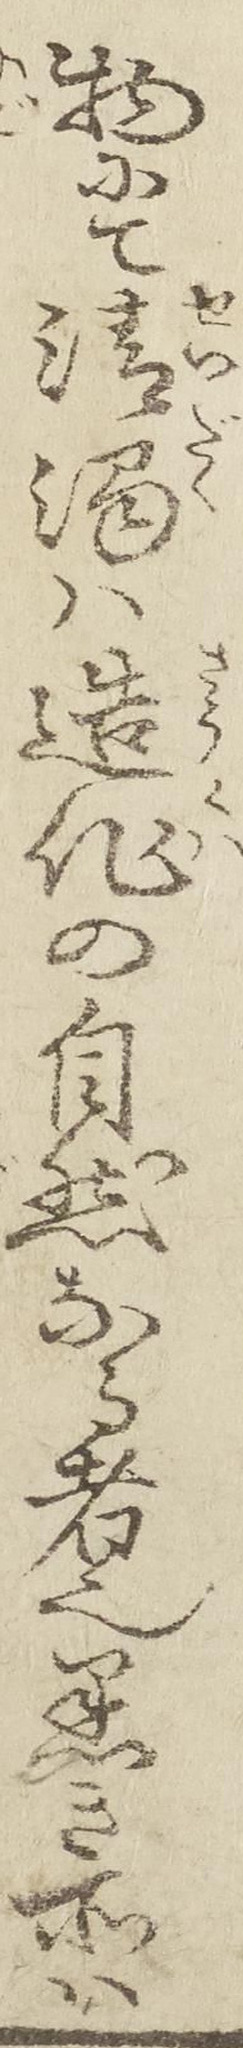物にて清濁は造化の自然なる者也黒き所は
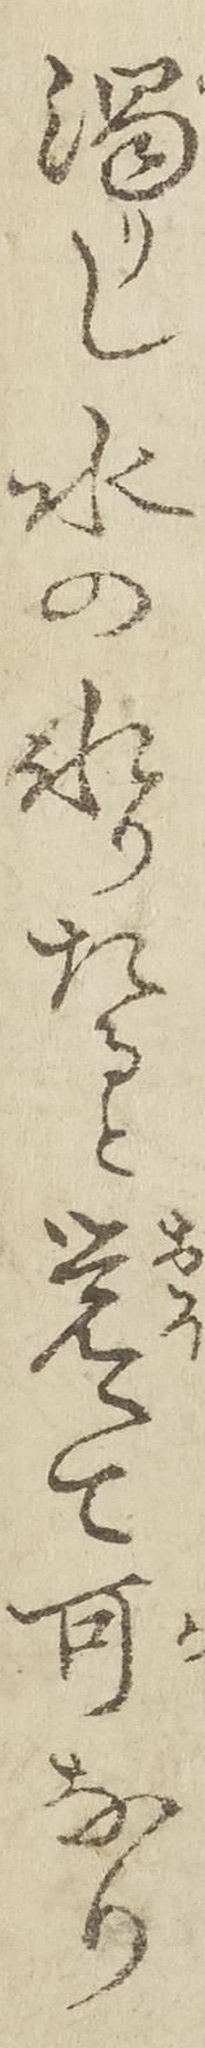濁リし水の氷たると覚へて可なり

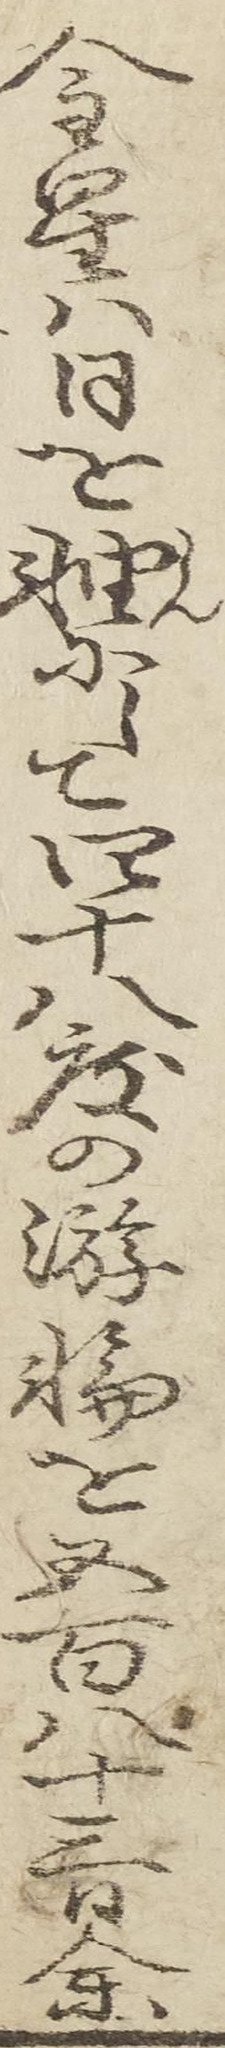金星は日を軸にして四十八度の游輪を五百八十三日余
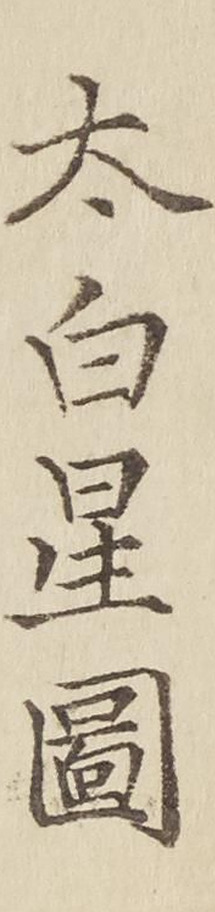太白星図
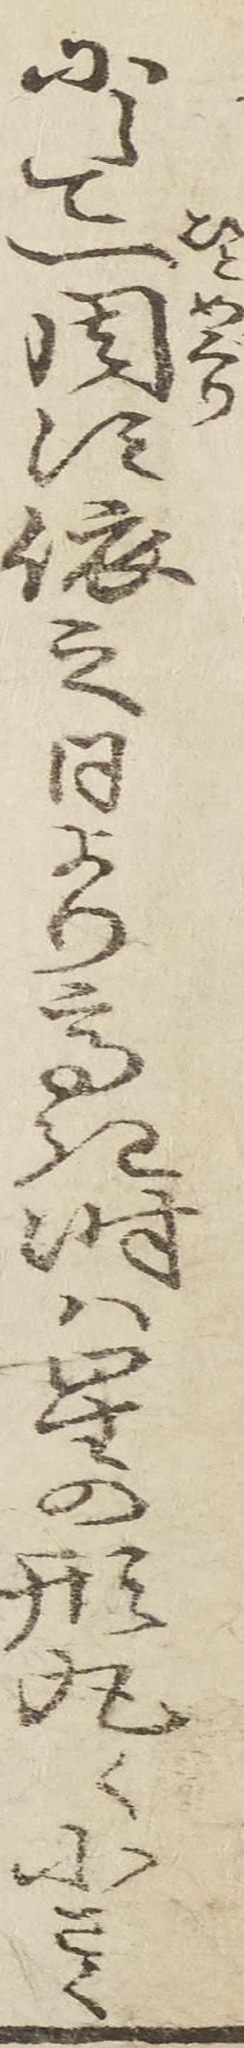にして一周す依之日より高き時は星の形丸く小さく
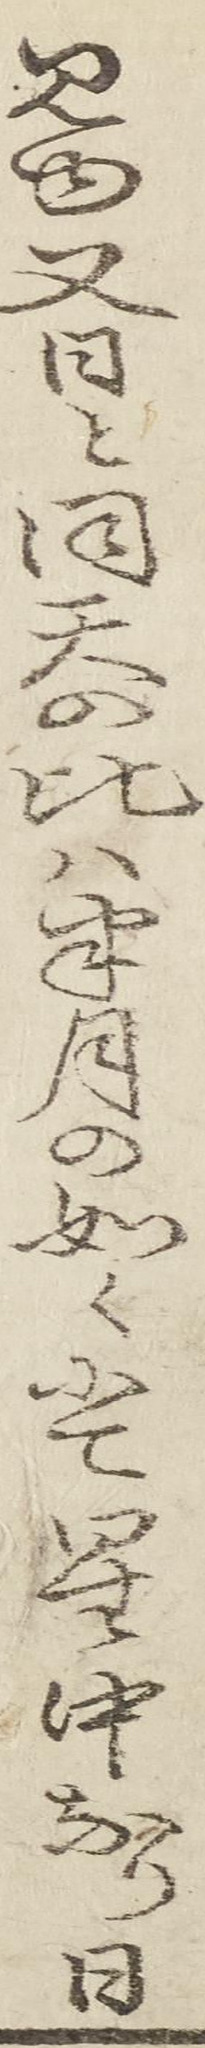見ゆ又日と同天の比は半月の如くにて星中なり日
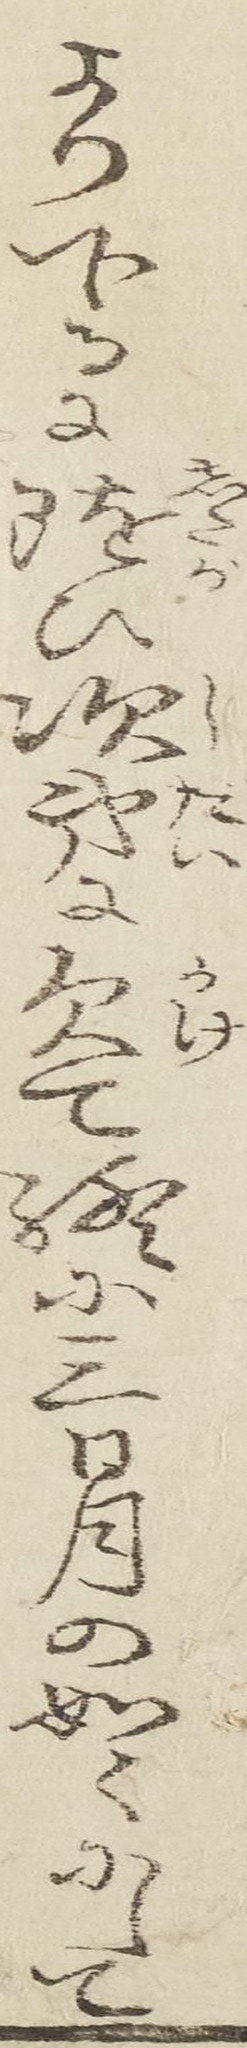より下るに随ひ次第に欠て終に三日月の如くにして
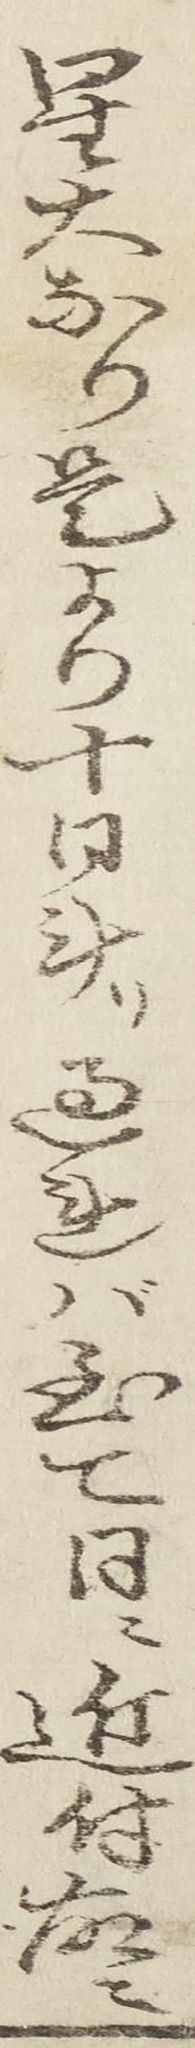星大なり是より十日計り過れば至て日ニ近付故ニ
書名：平天儀圖解
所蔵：東京大学地震研究所図書室 Earthquake Research Institute Library, The University of Tokyo, JAPAN
